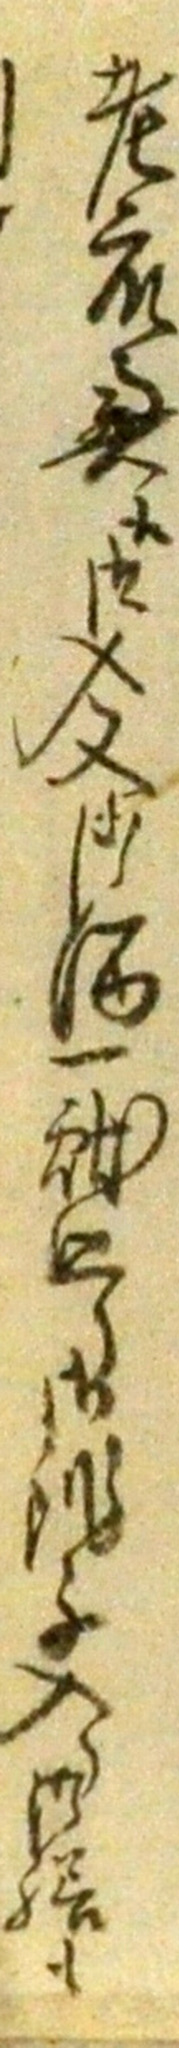老衆奥え御入又御酒一献廻り御銚子入り御膳も
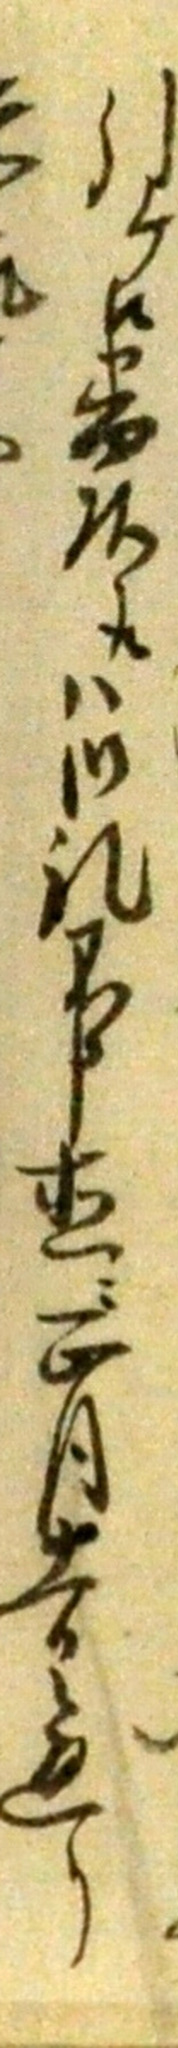引ケ候番頭えハ御礼不申直ニ正月十一日之通り
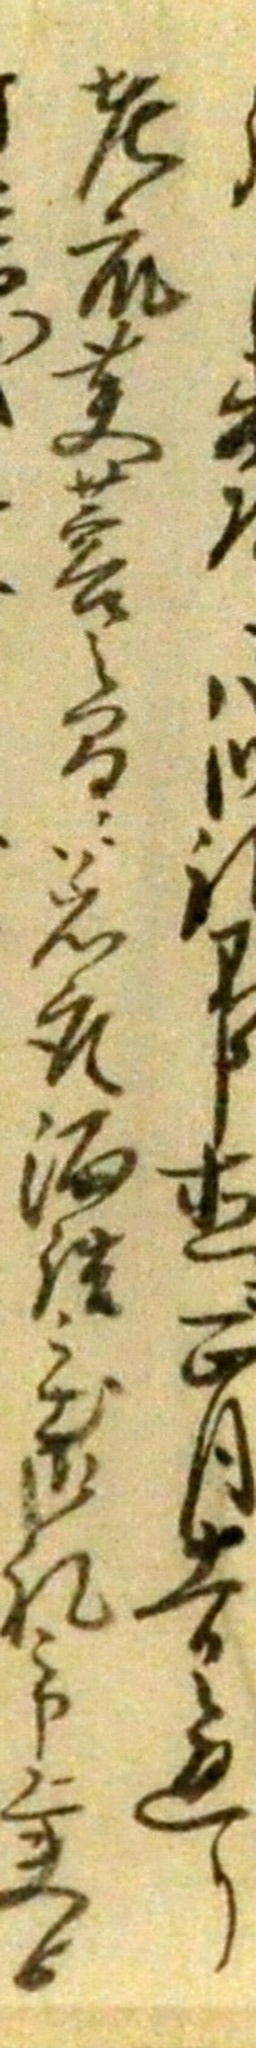老衆芙蓉之間ニ着座溜詰被出御礼被申上夫ゟ
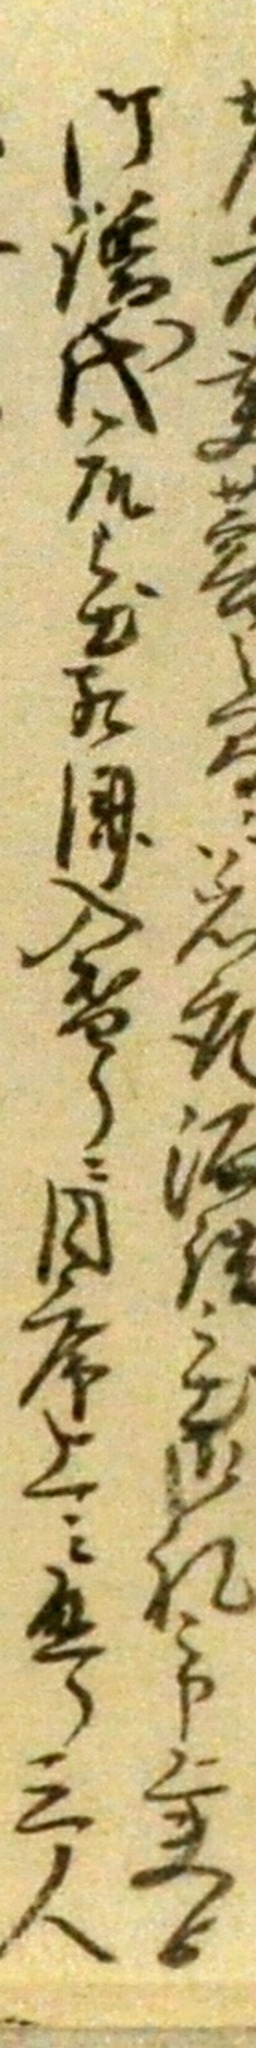御譜代衆被出相済入替りニ同席上ミ通り三人
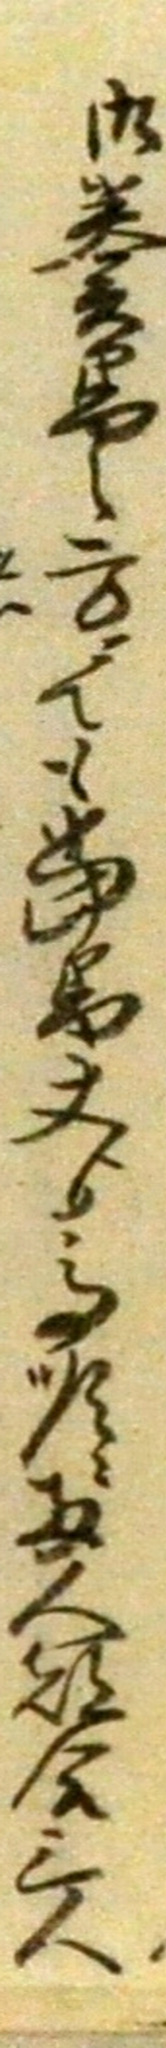御奏番之方ニても当番夫ゟ高順ニ両人都合三人
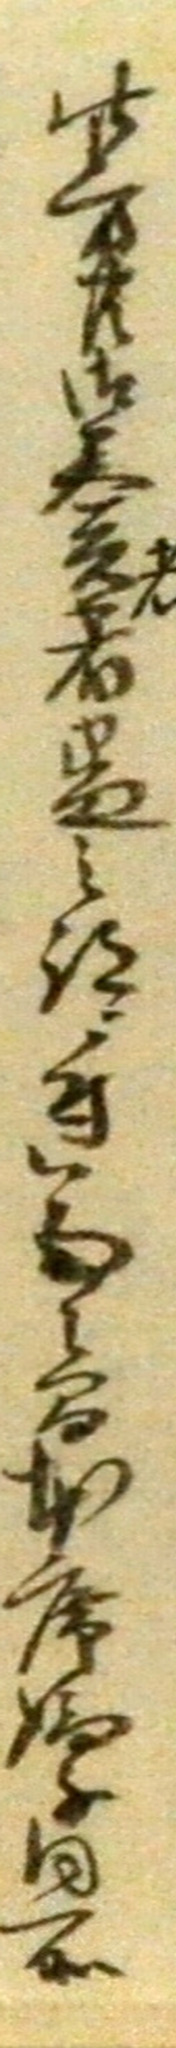此方共御奏者番之跡ニ付菊之間本席嫡子同所
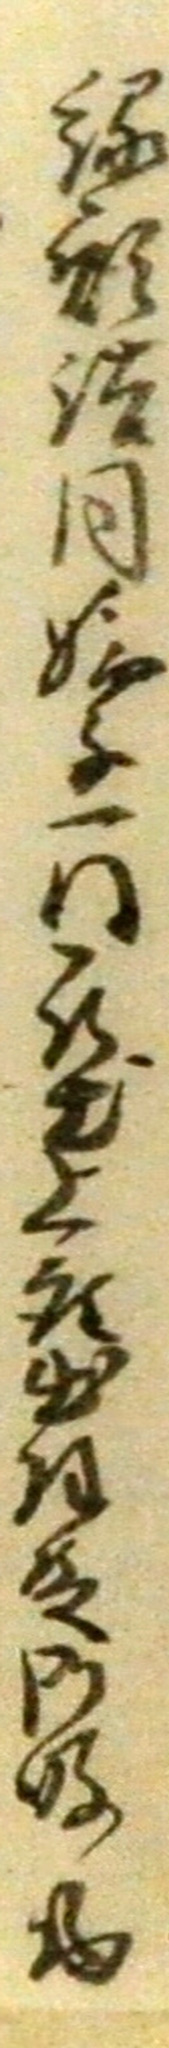縁頬詰同嫡子一同罷出上座出羽殿御吸物
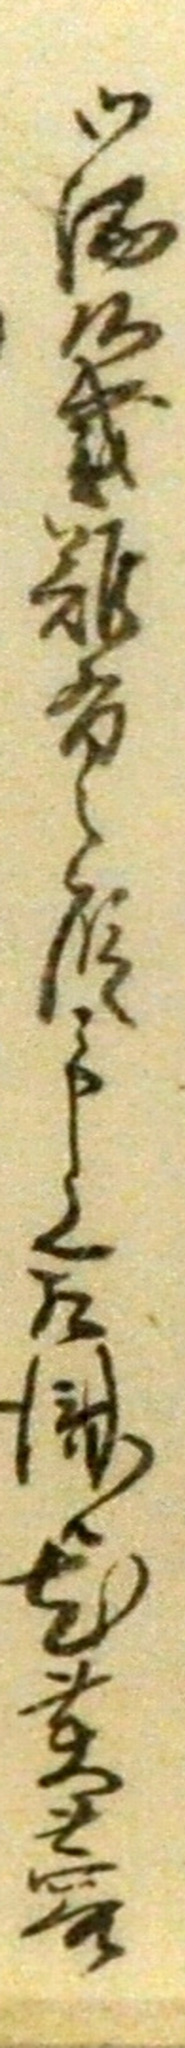御酒頂戴難有之段被申上相済候尤芙蓉
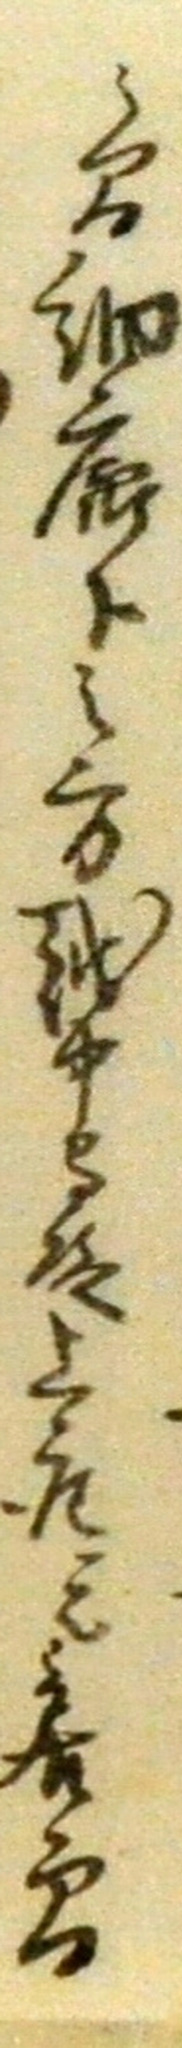之間細廊下之方越中守殿上座ニて被居候間
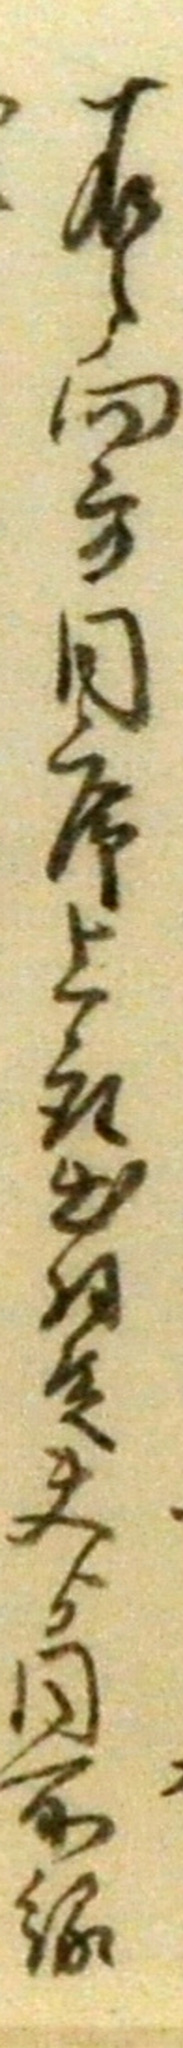右之向方同席上座出羽殿夫ゟ同所縁
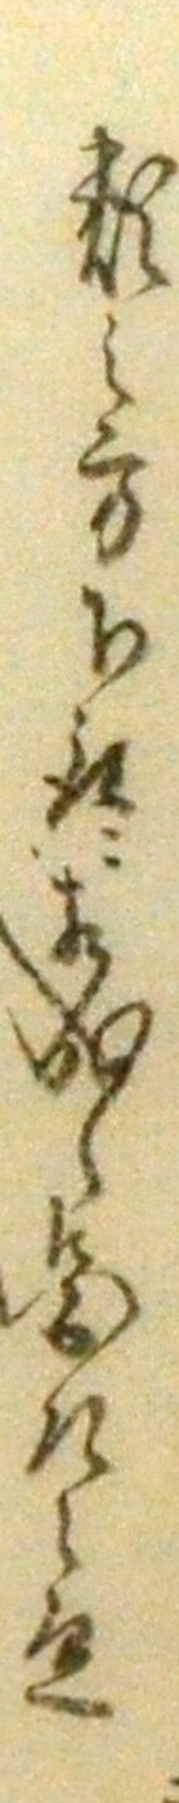頬之方下座ニ相成候図左之通

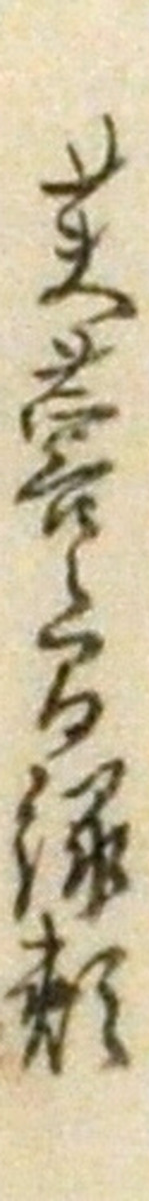芙蓉之間上菊
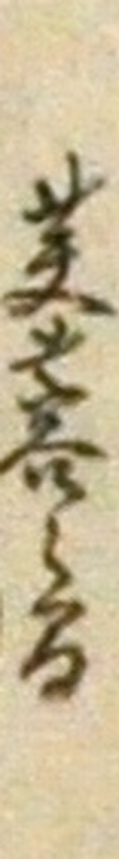芙蓉之間
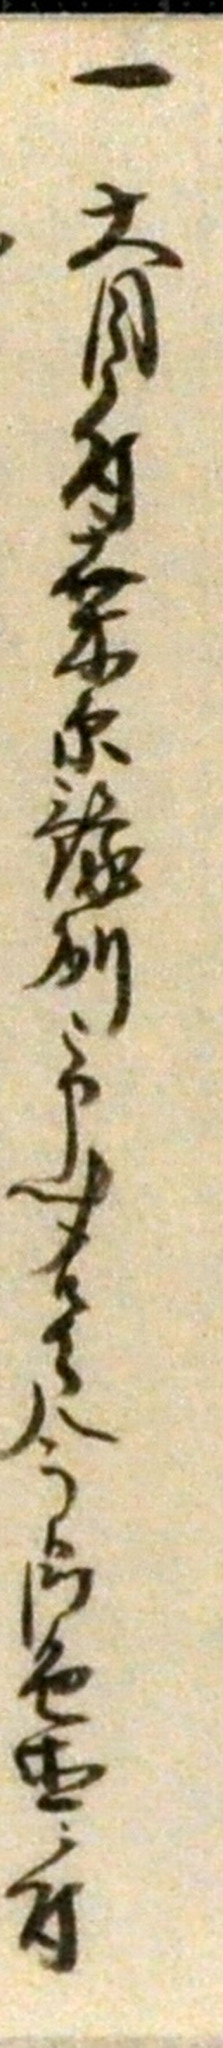一大目付桑原豫州被申聞候は今日御色直ニ付
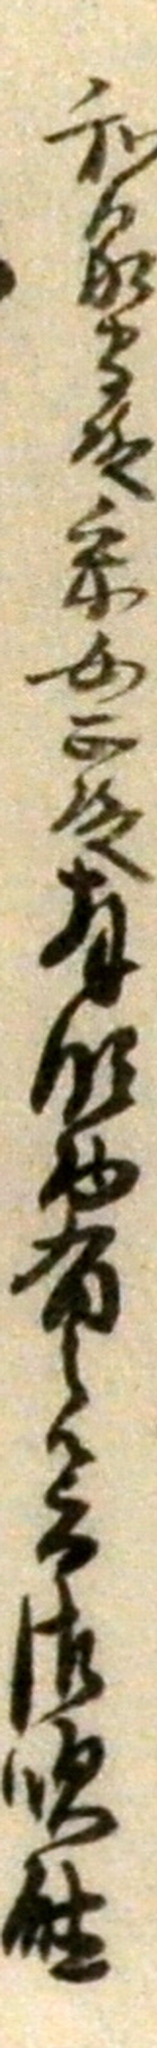和泉守殿采女正殿拝領物有之候旨御吹聴
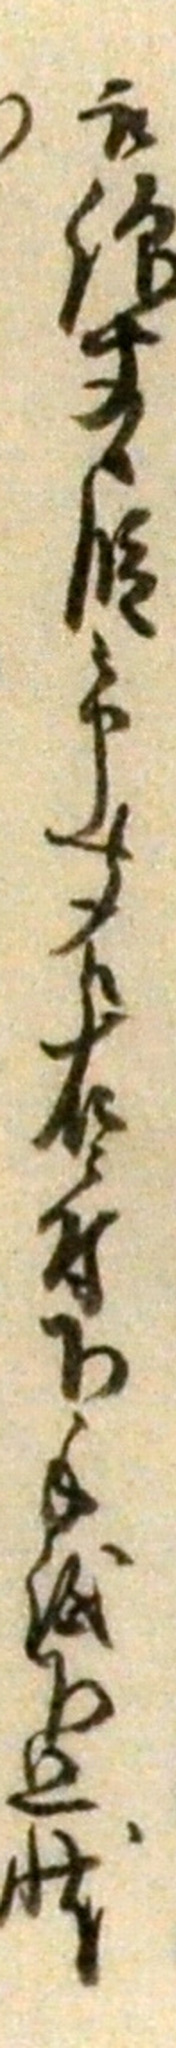被仰聞候段被申聞候右ニ付下手紙下廻状
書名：若君様御色直御祝儀ノ節ノ留
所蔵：伊那市立高遠町図書館・合同会社AMANE
